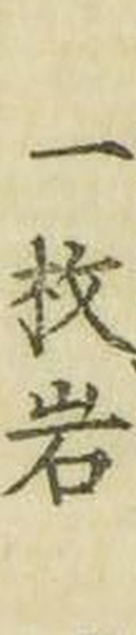一枚岩
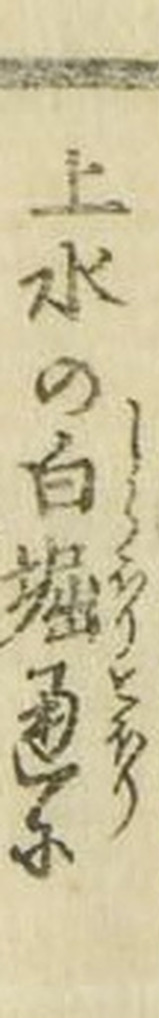上水の白堀通に
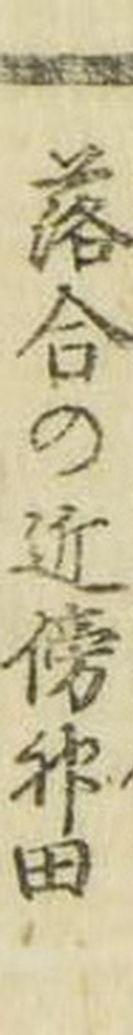落合の近傍神田
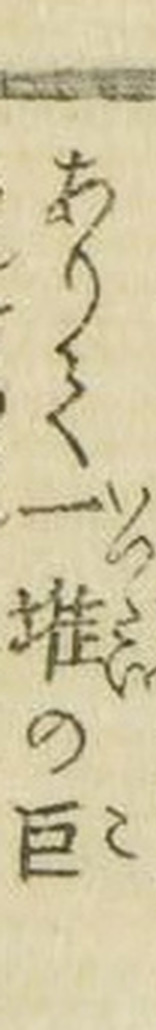ありて一堆の巨
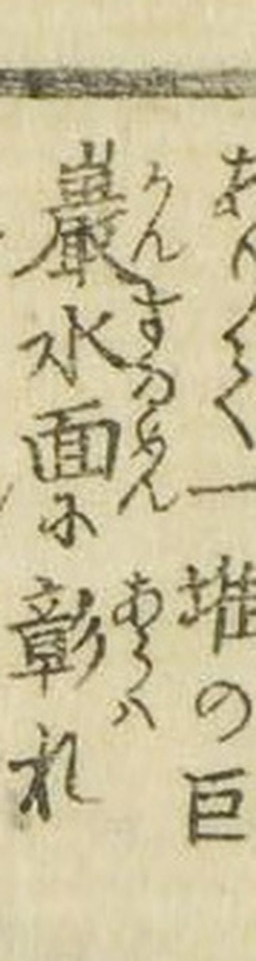巌水面に彰れ
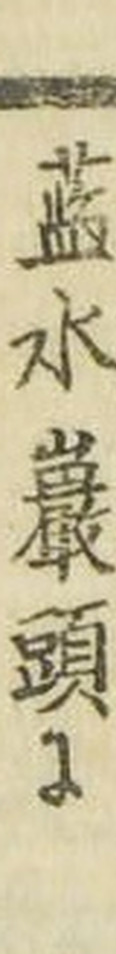藍水巌頭に
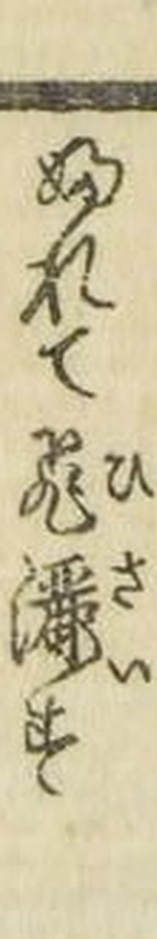ぬれて飛灑す
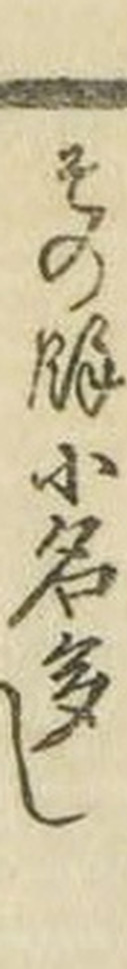その餘小名多し
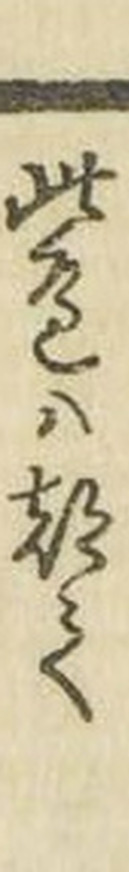此邊は都て
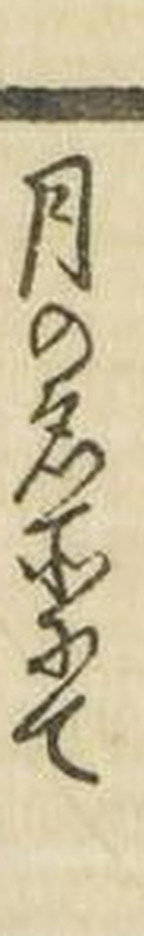月の名所にて

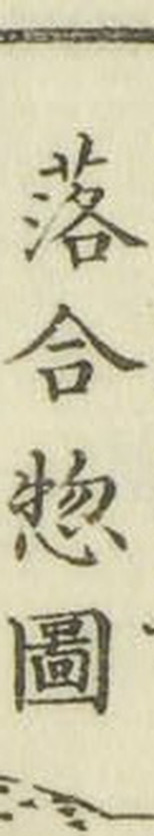落合惣圖

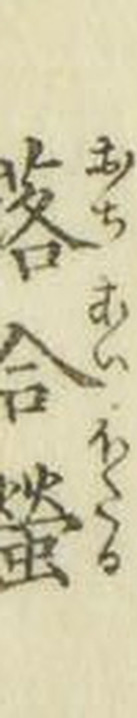落合螢
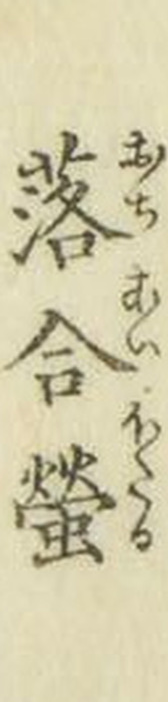落合螢
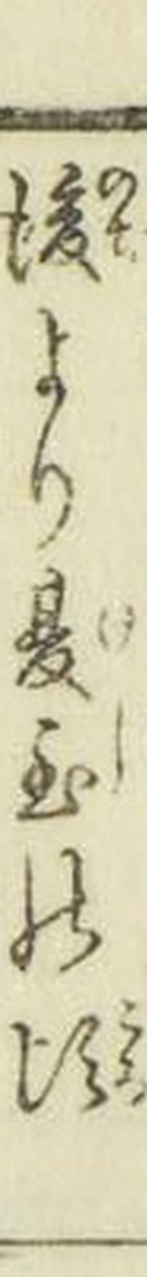後より夏至の頃
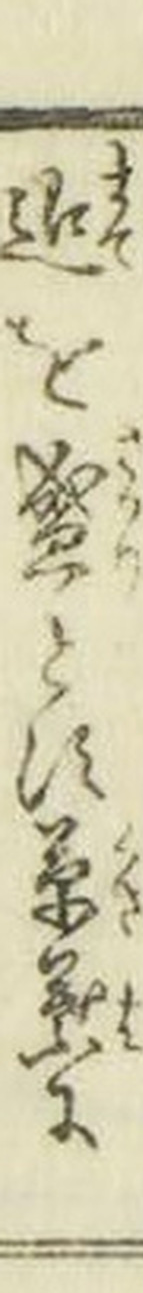迄盛とす草葉に
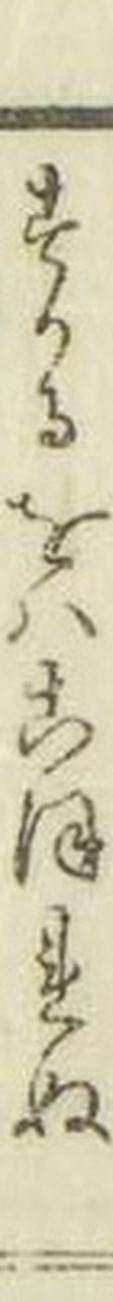すかるをはこほれぬ
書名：江戸名所図会 20巻 巻之12
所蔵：東京学芸大学教育コンテンツアーカイブ
